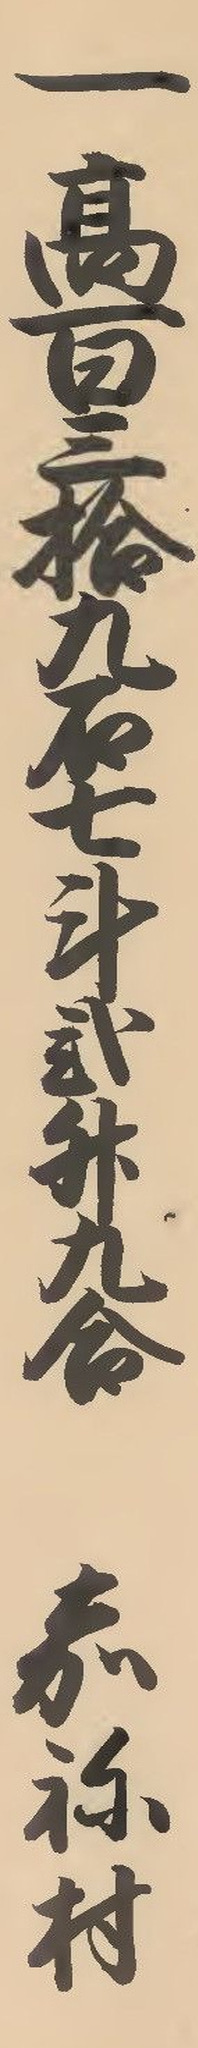一髙百三拾九石七斗弐升九合嘉称村
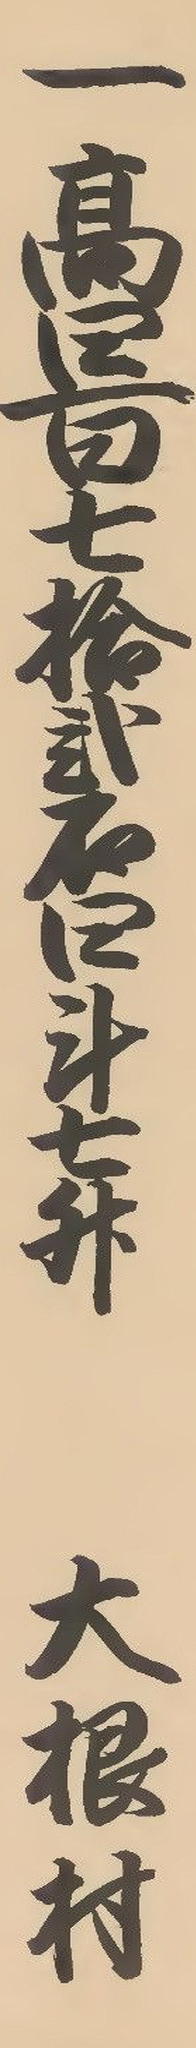一髙四百七拾弐石四斗七升大根村
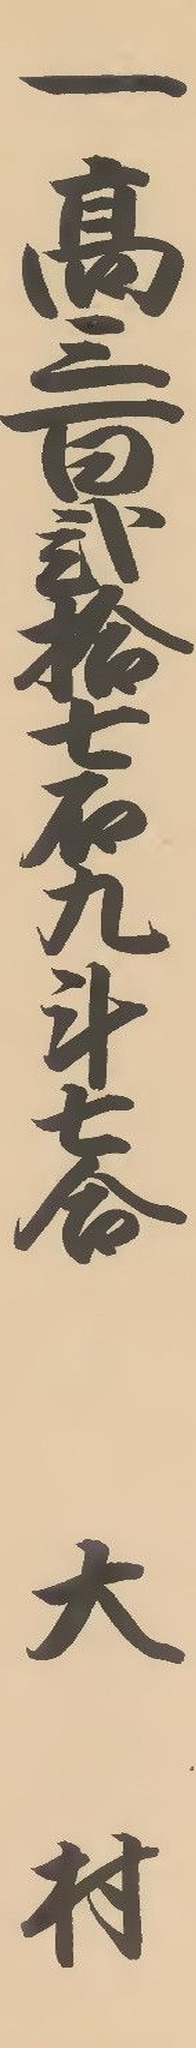一髙三百弐拾七石九斗七合大村

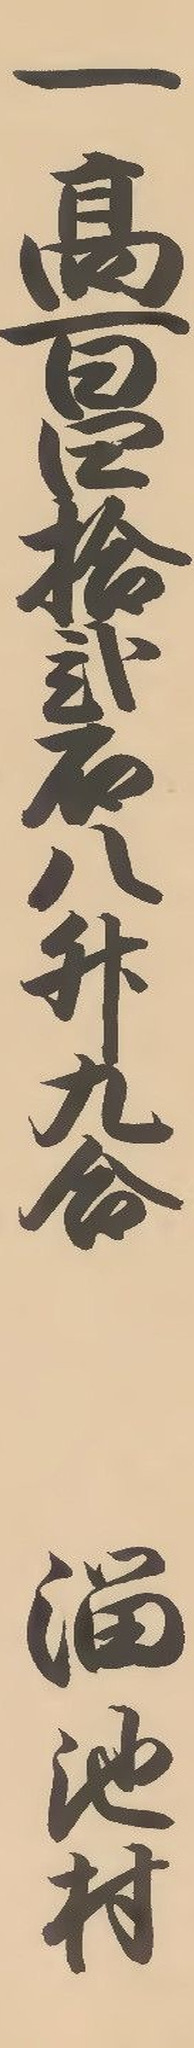一髙百四拾弐石八升九合溜池村
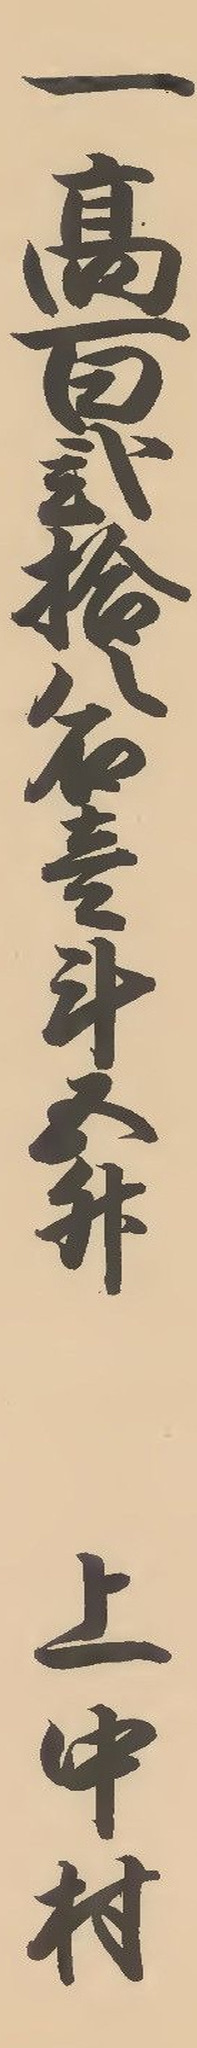一髙百弐拾八石壱斗五升上中村
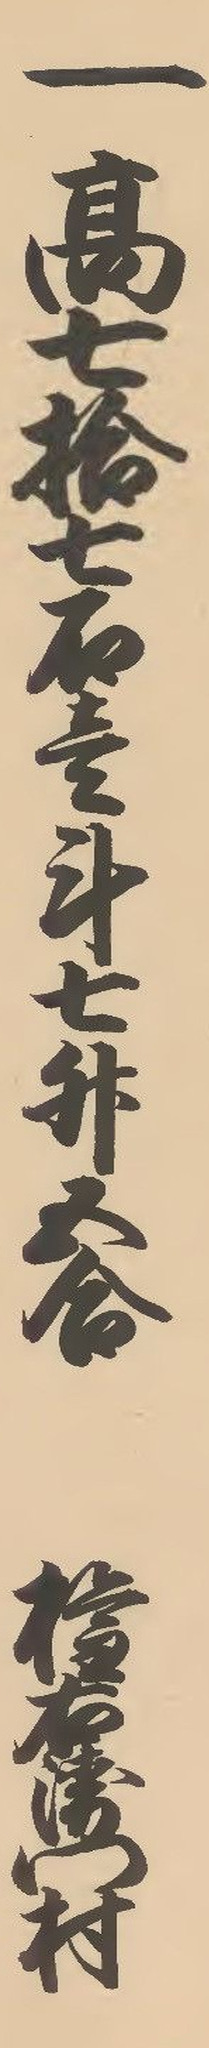一髙七拾七石壱斗七升五合権右衛門村
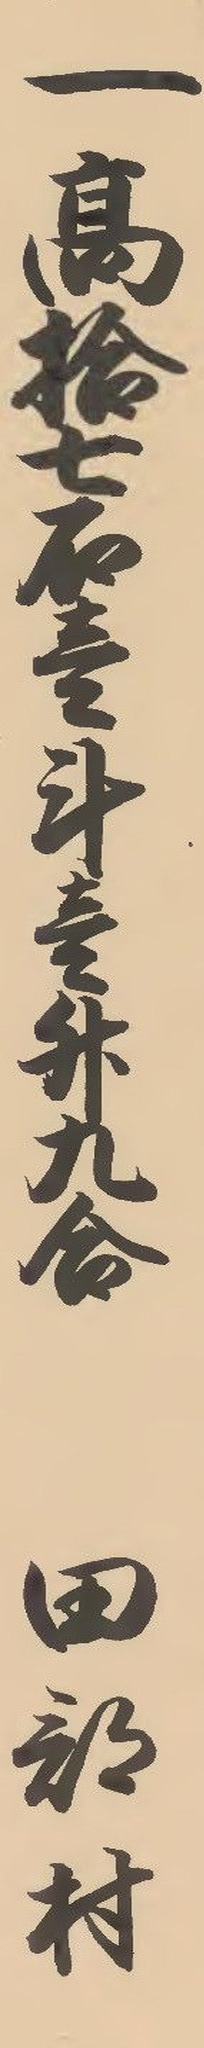一髙拾七石壱斗壱升九合田部村
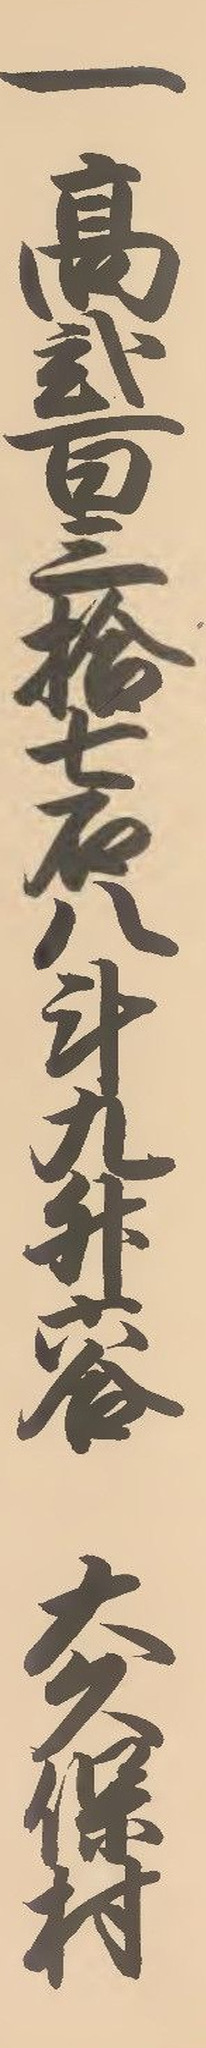一髙弐百三拾七石八斗九升六合大久保村
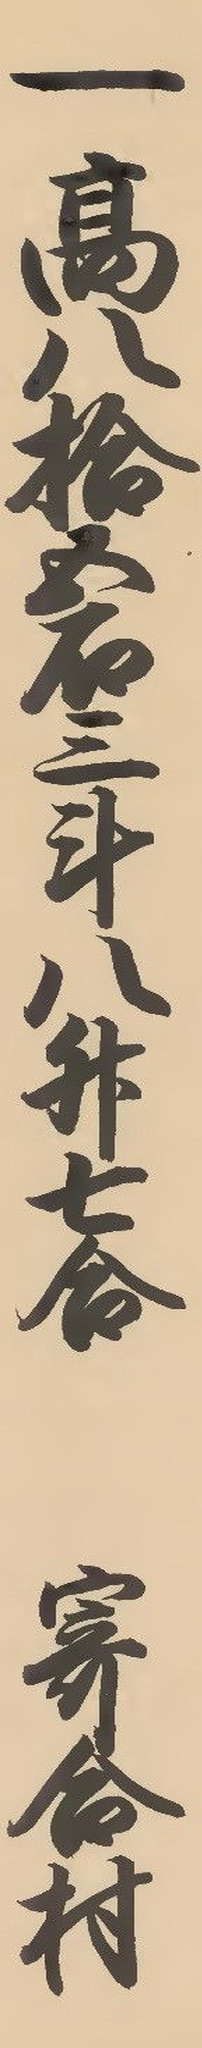一髙八拾五石三斗八升七合寄合村
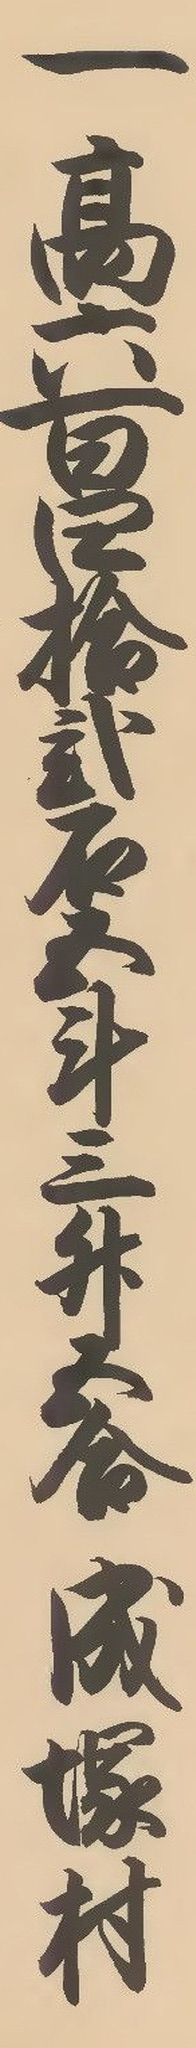一髙六百四拾弐石五斗三升五合成塚村

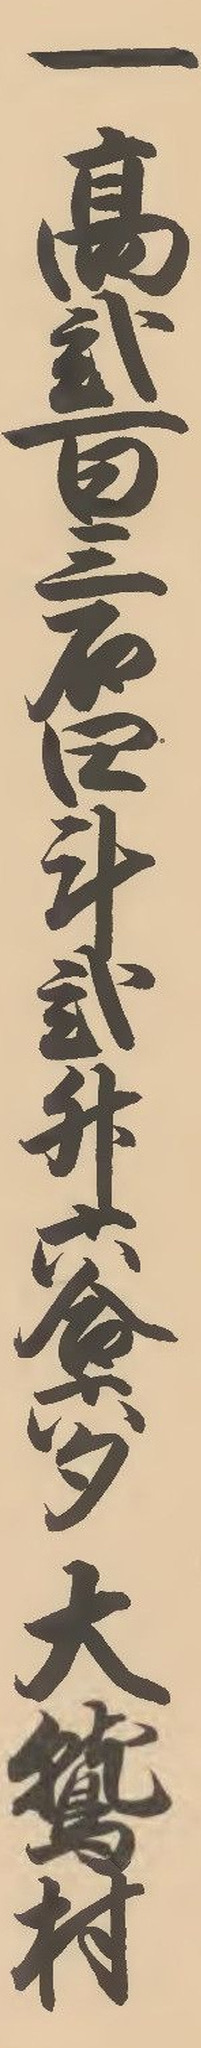一髙弐百三石四斗弐升六合六夕大鷲村
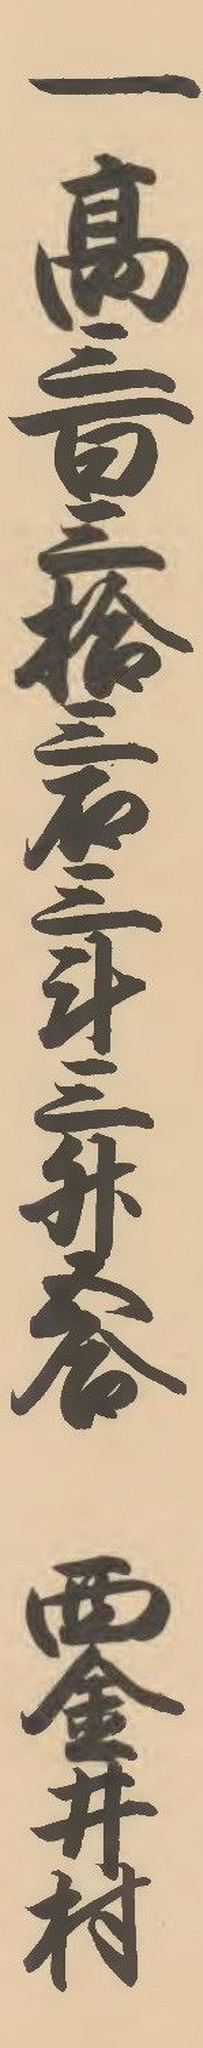一髙三百三拾三石三斗三升五合西金井村
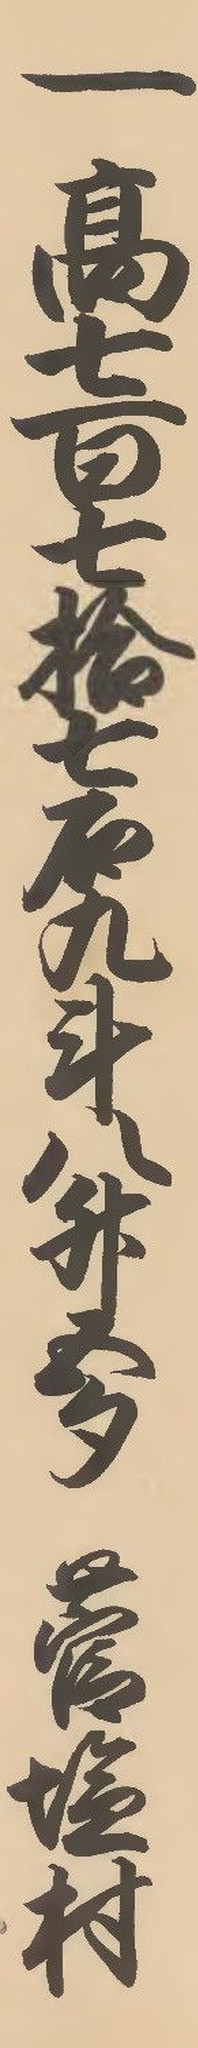一髙七百七拾七石九斗八升五夕菅塩村
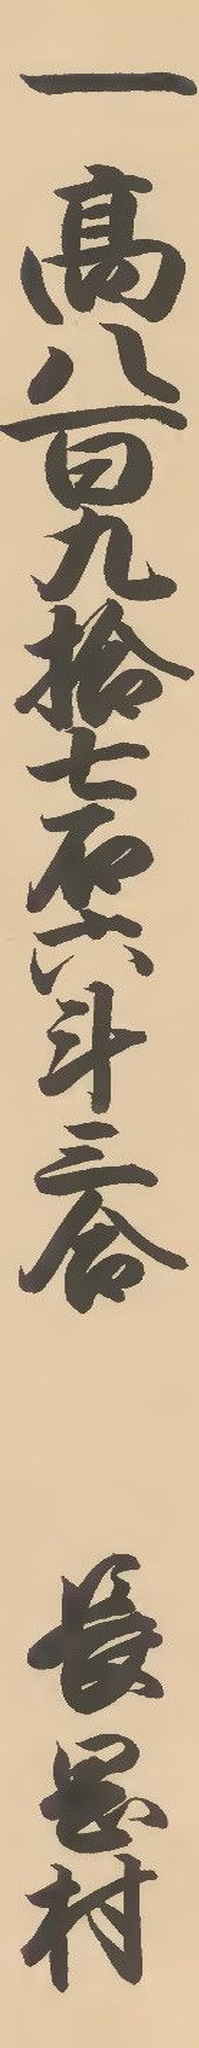一髙八百九拾七石六斗三合長岡村
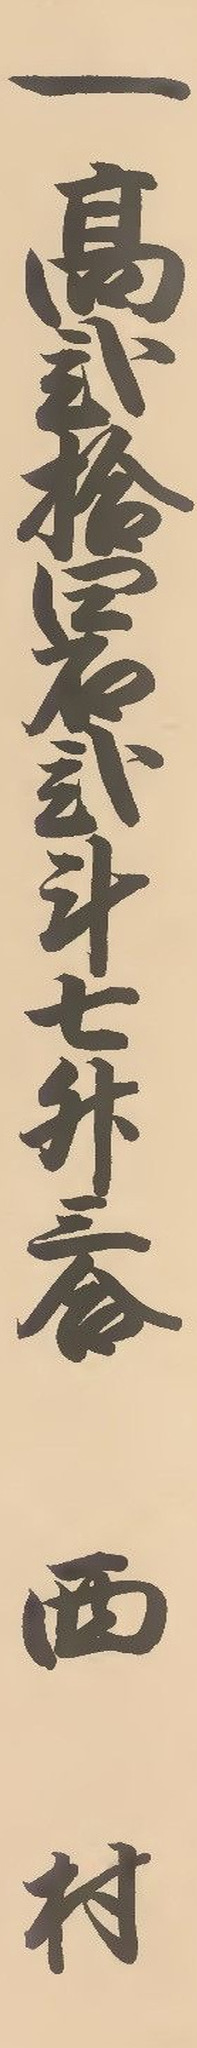一髙弐拾四石弐斗七升三合西村
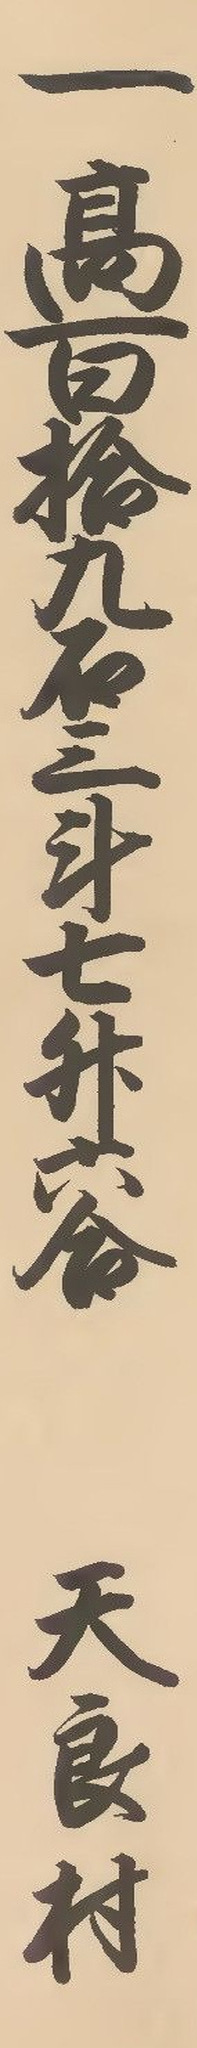一髙百拾九石三斗七升六合天良村
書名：上野国郷帳
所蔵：国立公文書館 National Archives of Japan
